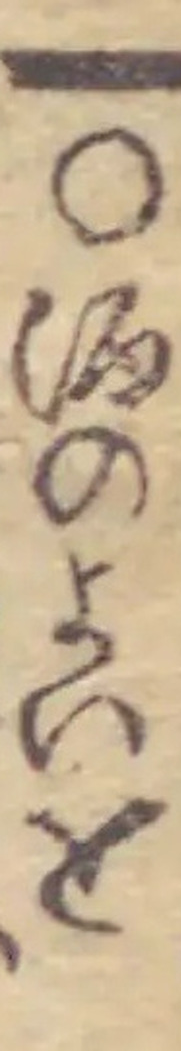○酒のよいを
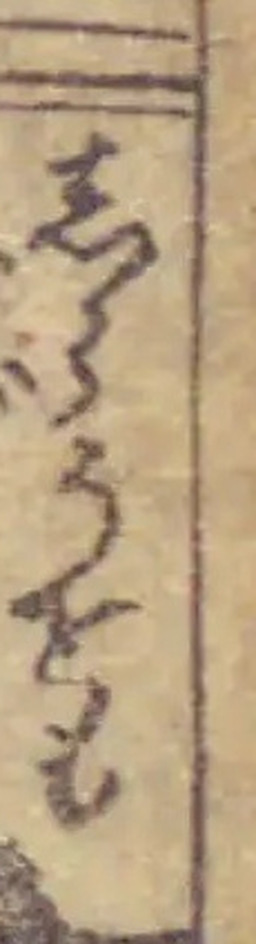しらうとも
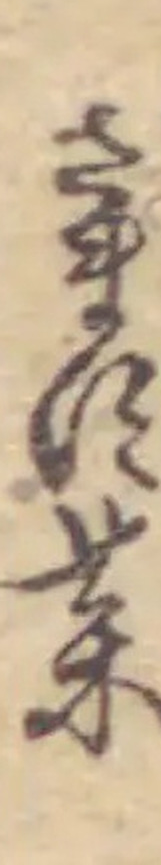さます薬
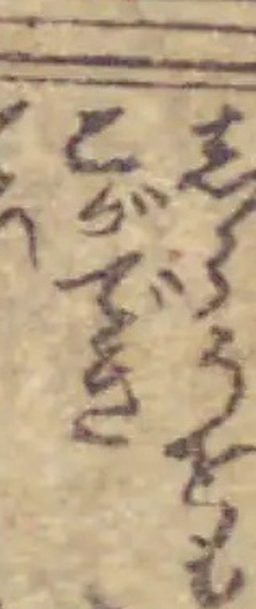こができ
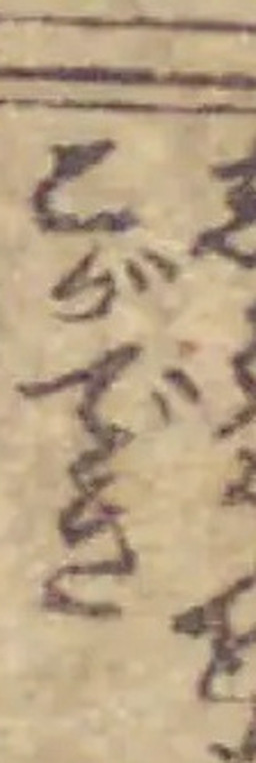こができ
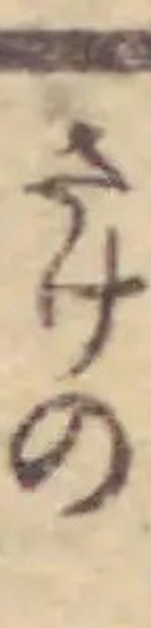さけの
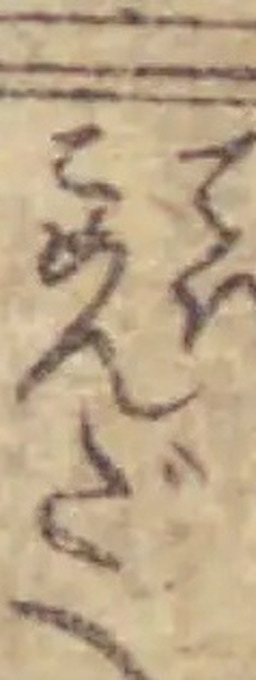こめんだ
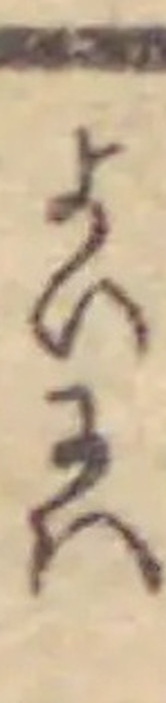よいには
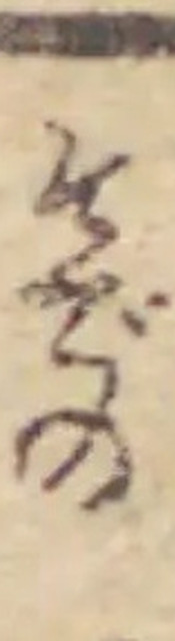そばの
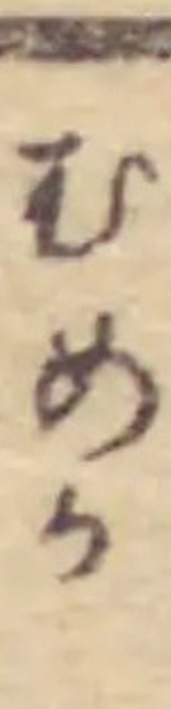むめか
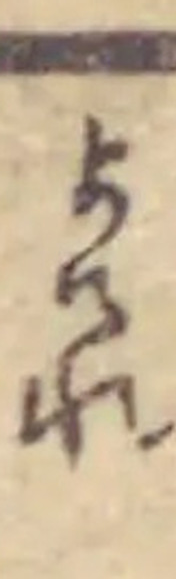よけれ
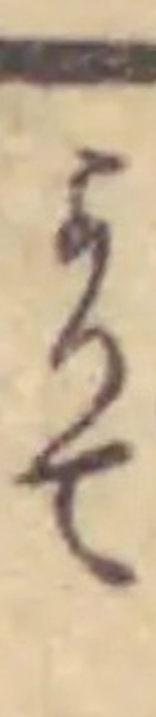よりて
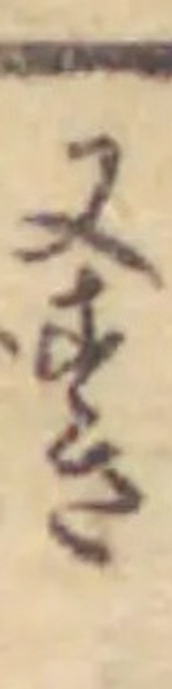又すさ
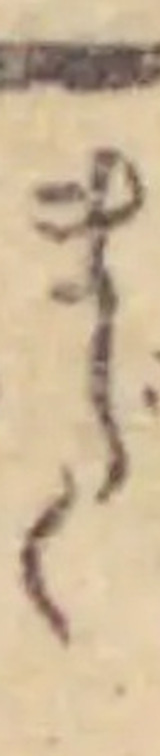まじく
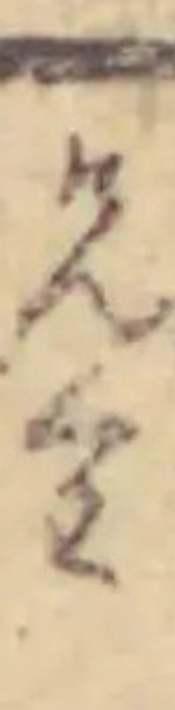けんくわ
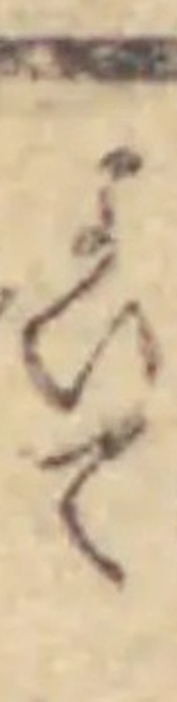よいて
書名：家伝寿命薬 2巻
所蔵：国立国会図書館 National Diet Library, JAPAN
